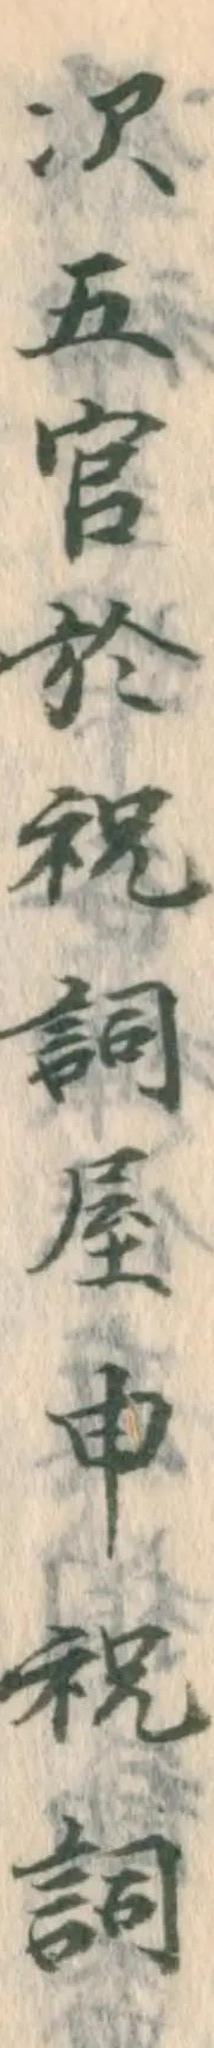次五官於祝詞屋申祝詞
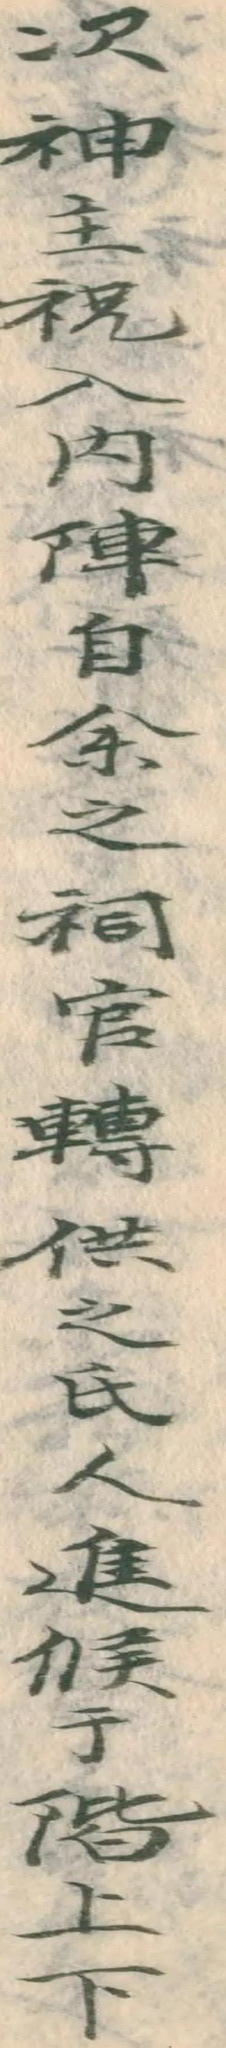次神主祝入内陣自余之祠官転供之氏人進候于階上下
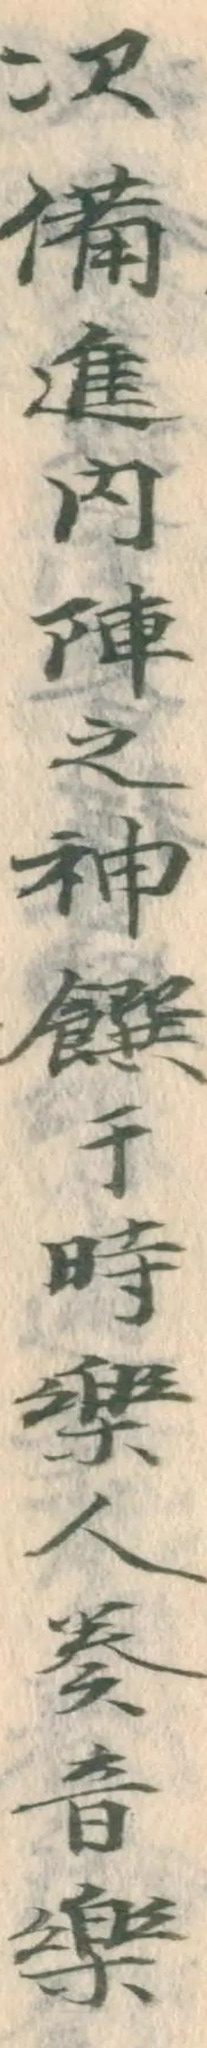次備進内陣之神饌于時楽人奏音楽
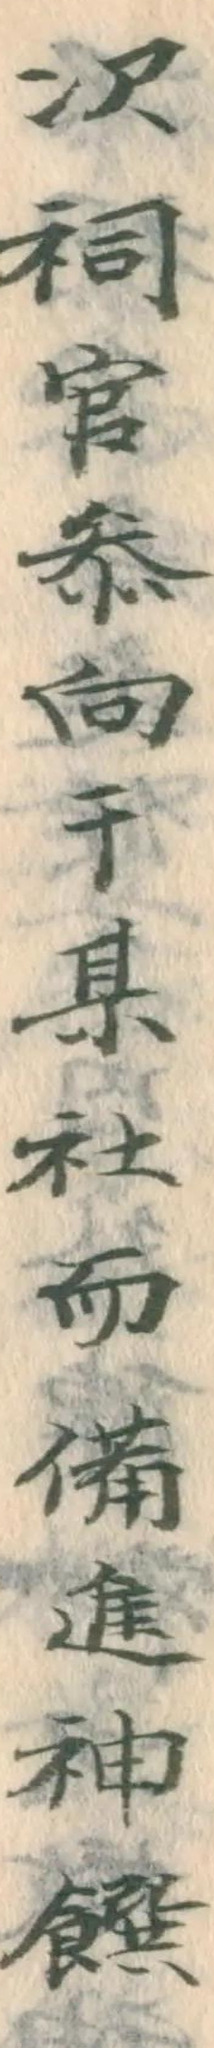次祠官参向于某社而備進神饌

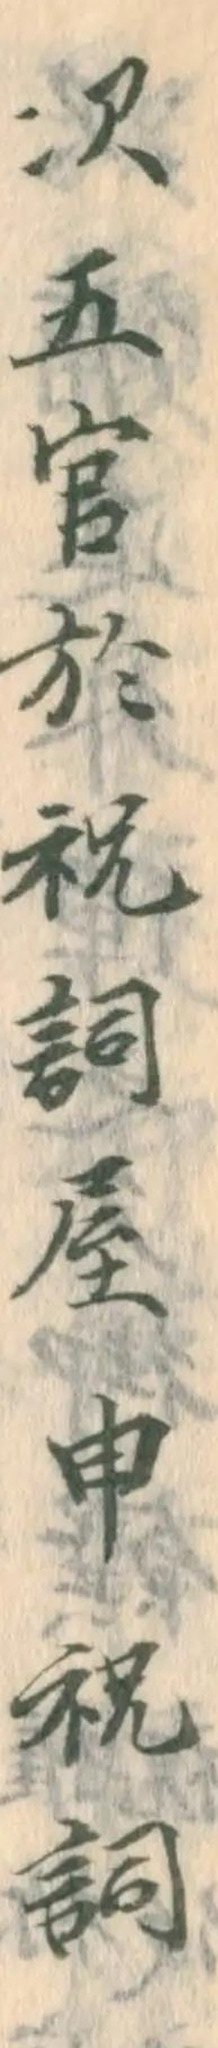次五官於祝詞屋申祝詞
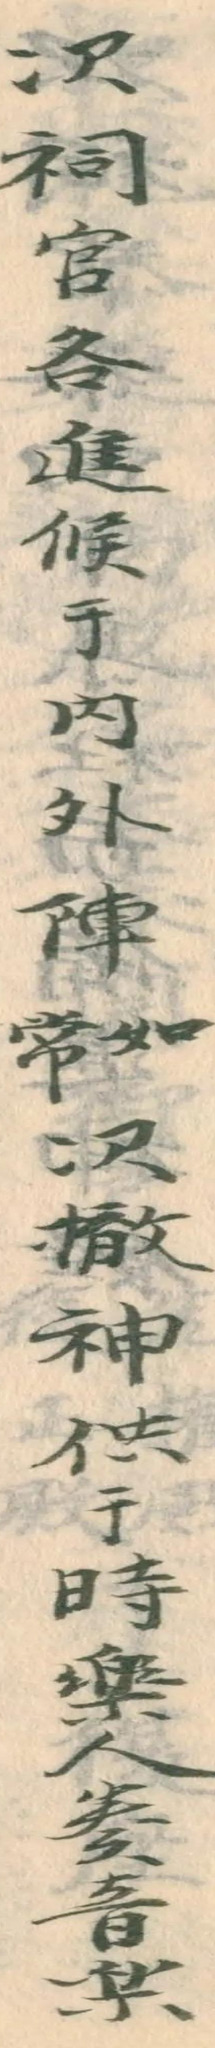次祠官各進候于内外陣如常次撤神供于時楽人奏音楽
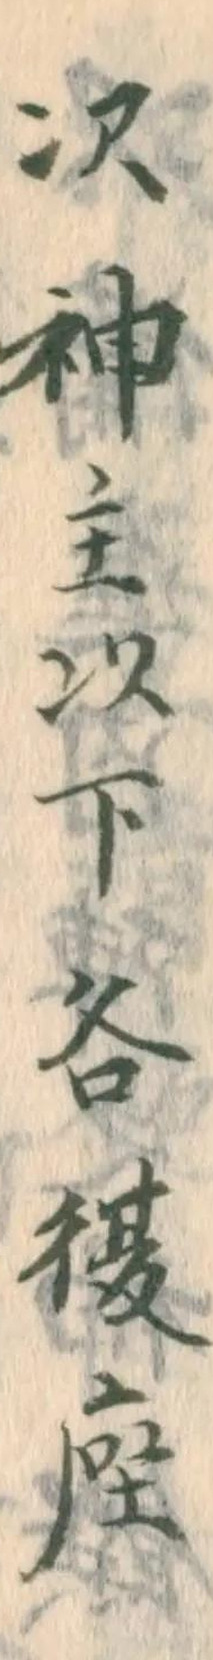次神主以下各復座
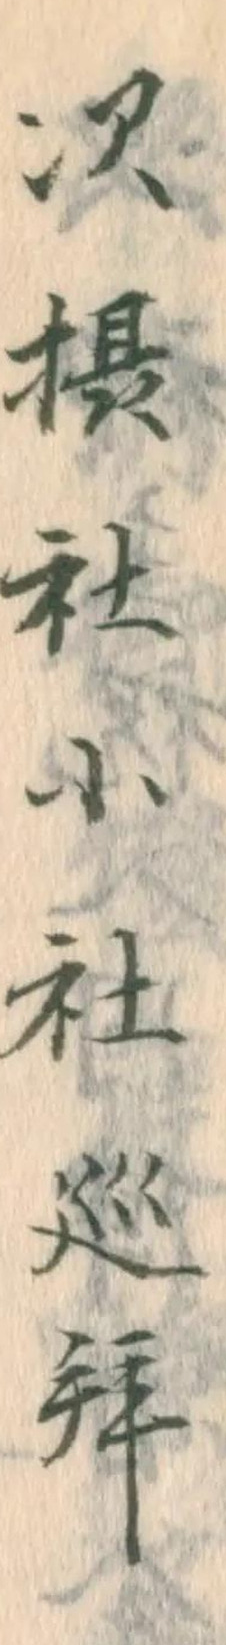次摂社小社巡拝
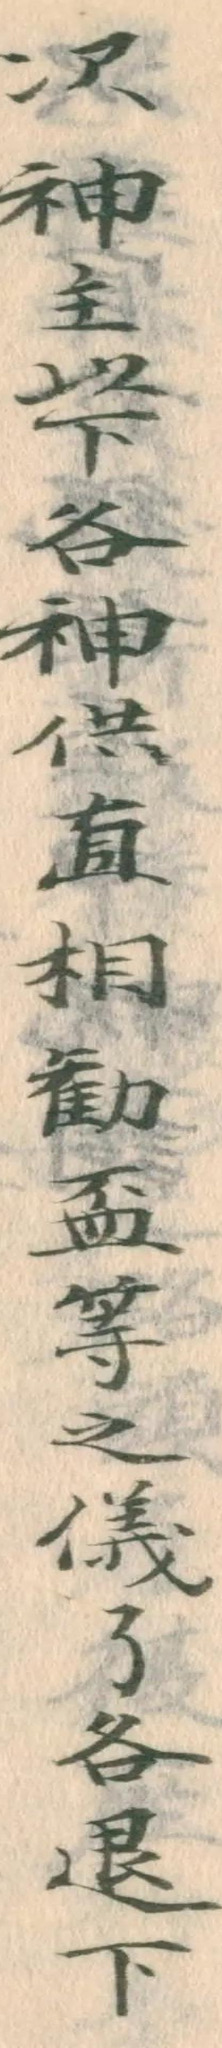次神主以下各神供直相勧盃等之儀了各退下
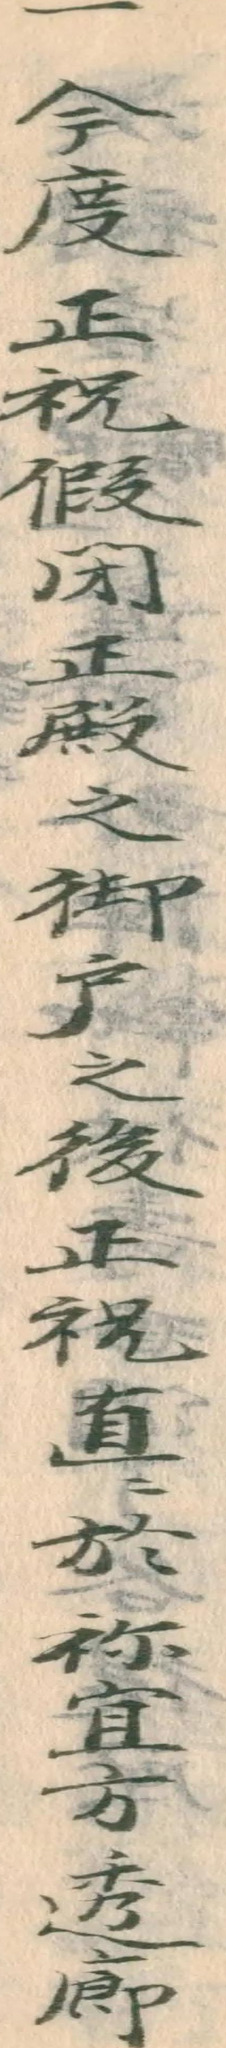一今度正祝仮閉正殿之御戸之後正祝直ニ於祢宜方透廊
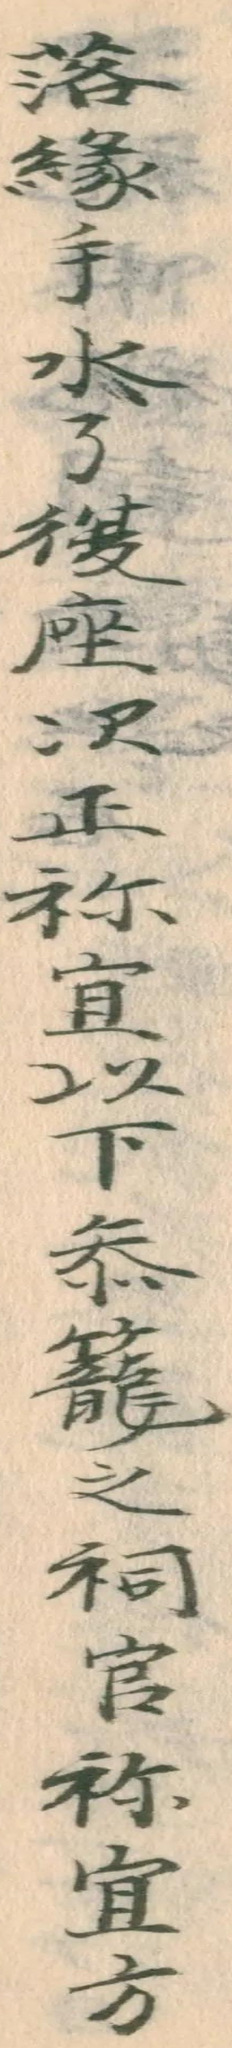落縁手水了復座次正祢宜以下参籠之祠官祢宣方
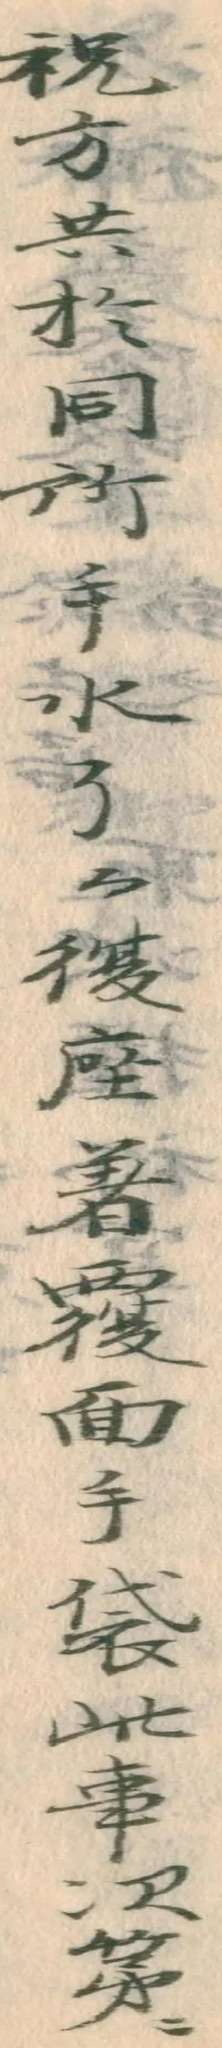祝方共於同所手水了而復座着覆面手袋此事次第ニ
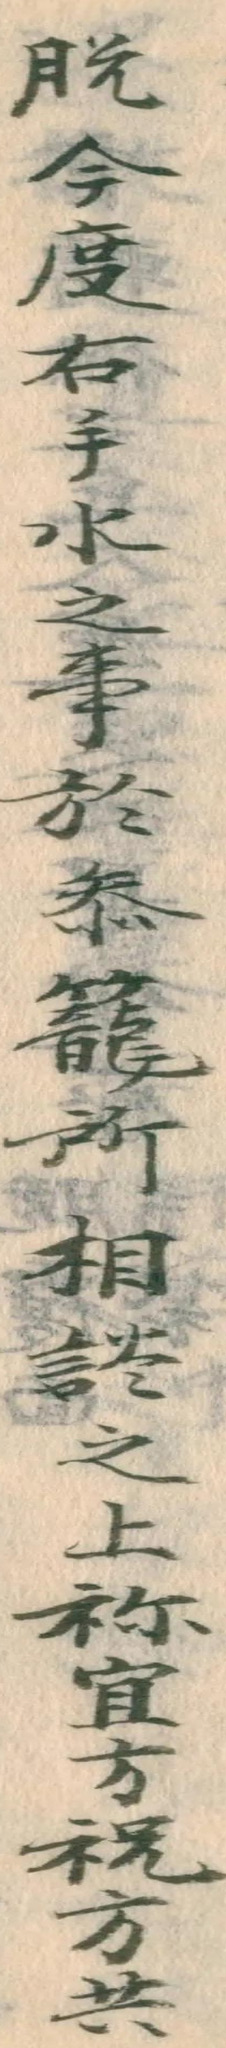脱今度右手水之事於参籠所相談之上祢宜方祝方共
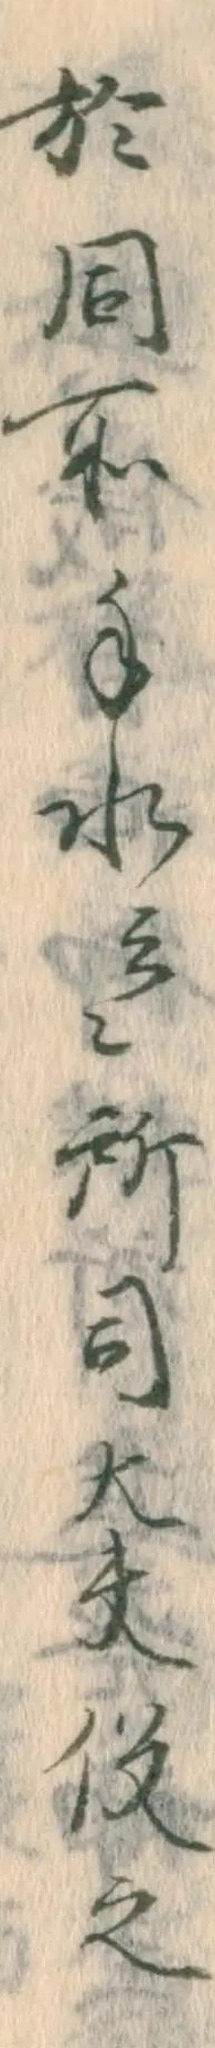於同所手水云々所司大夫役之
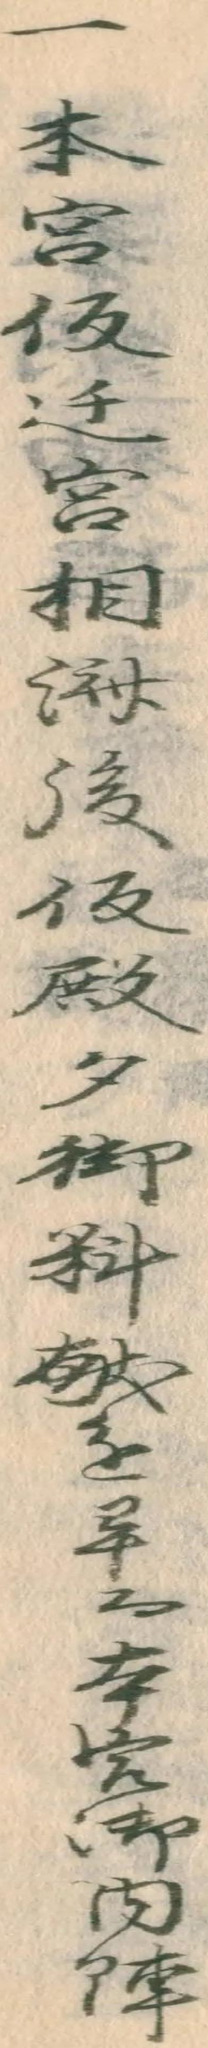一本宮仮迁宮相済後仮殿夕御料献進畢而本宮御内陣
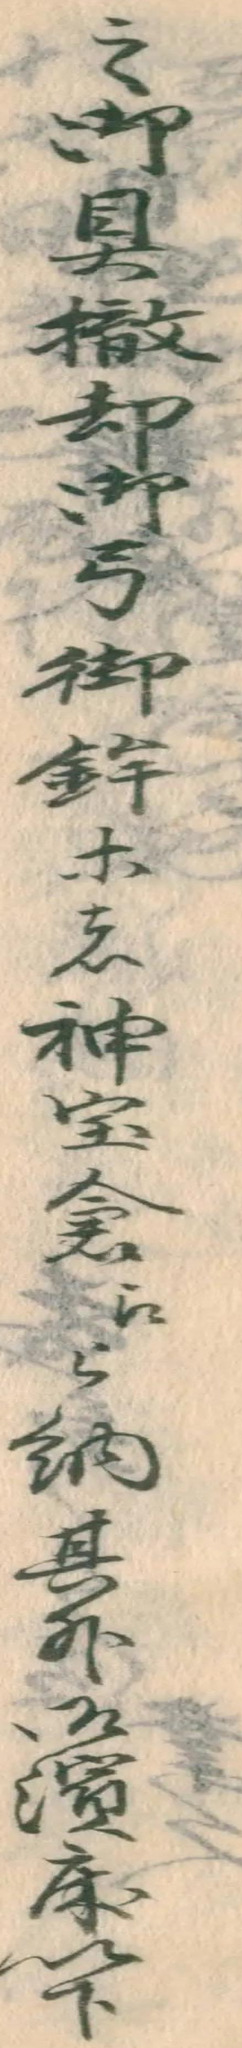之御具撤却御弓御鉾等は神宝倉江被納其外御浜床以下
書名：賀茂社記録. 第17冊
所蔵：国立国会図書館 National Diet Library, JAPAN
